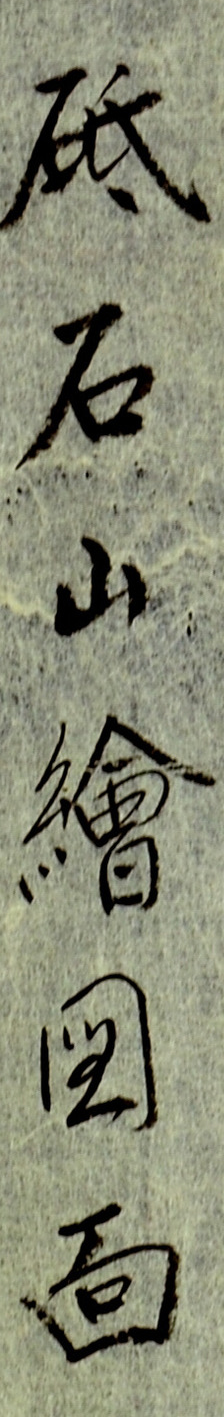砥石山絵図面

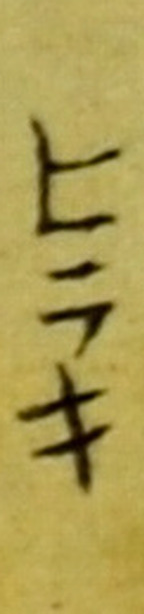ヒラキ
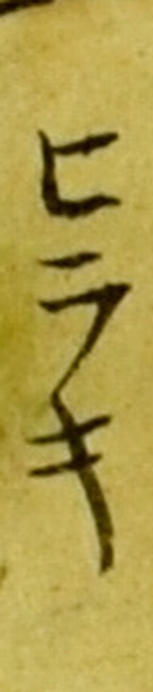ヒラキ
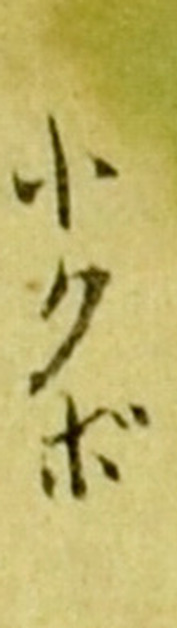小クボ
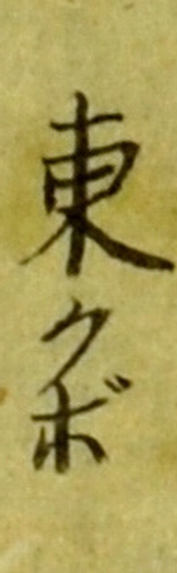小クボ
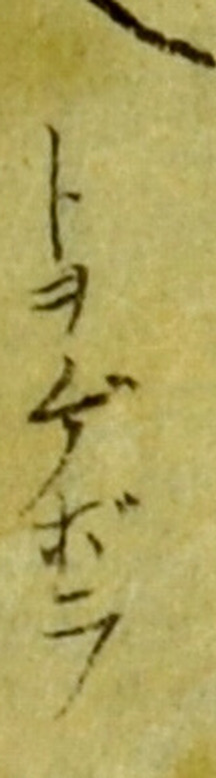トヲゲボラ
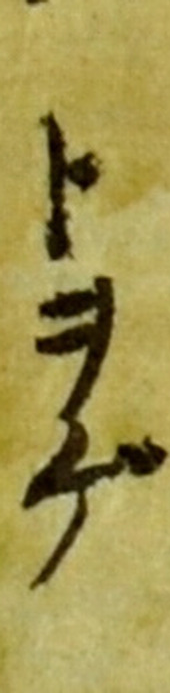トヲゲ
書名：乍恐以書付奉願上候御事
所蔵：伊那市立高遠町図書館・合同会社AMANE
